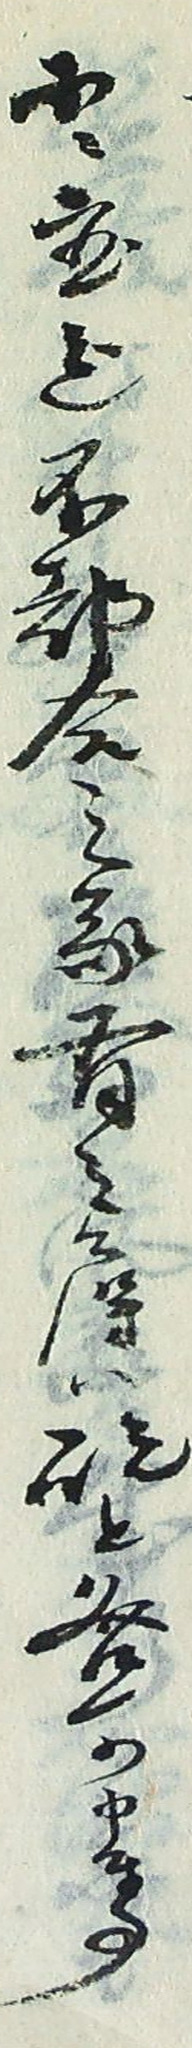等ニ至迄不都合之義有之候得ハ屹と咎可申付事
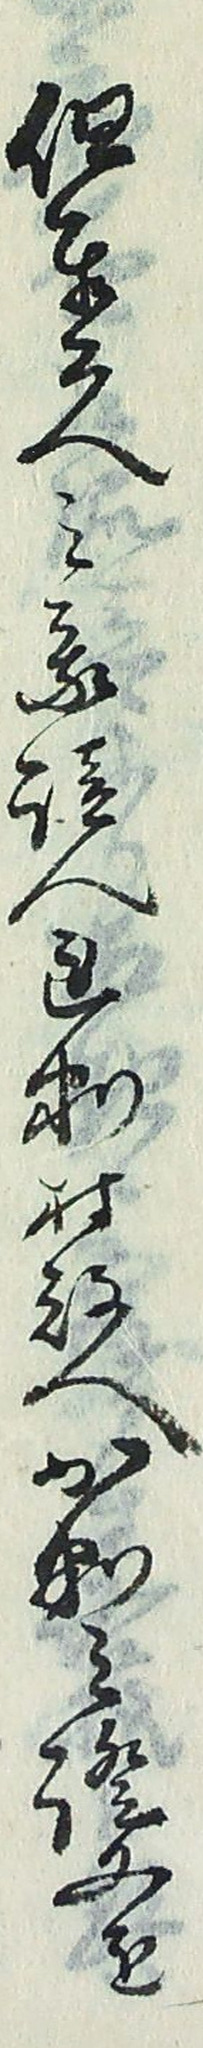但奉公人之義請人連判村役人加判之證文を
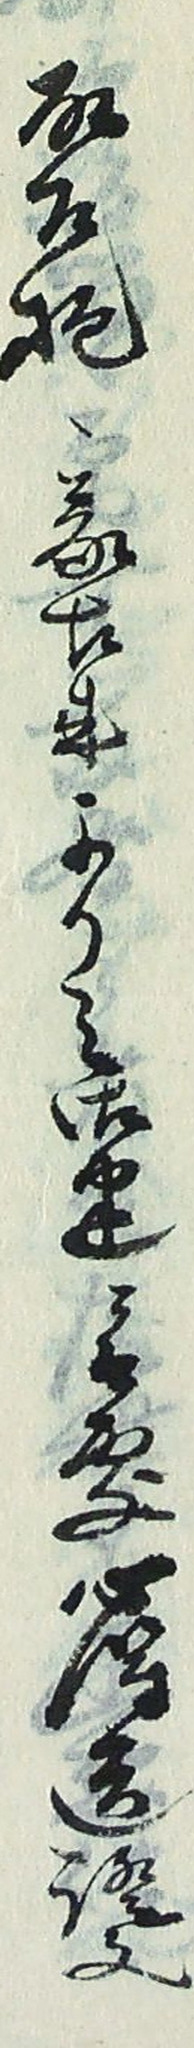取召抱候義古来より之御達ニ候處心得違證文
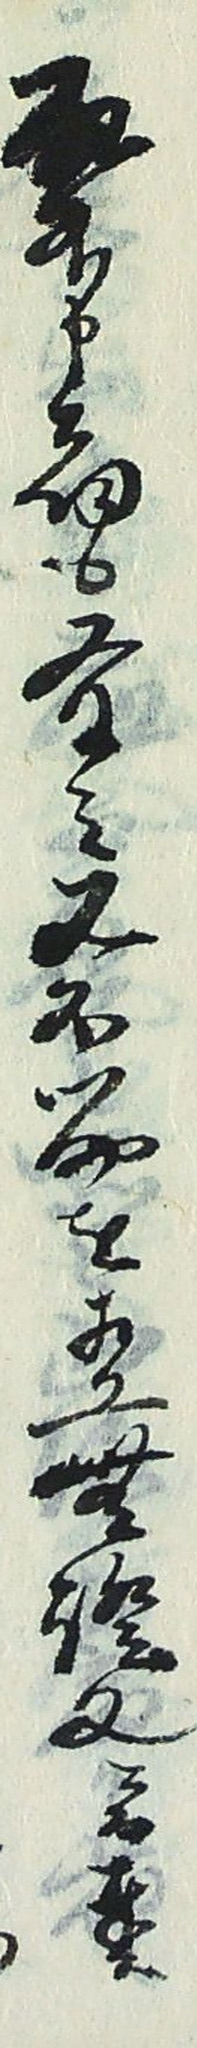取不申者も有之又不筋を相工無證文ニ而奉公
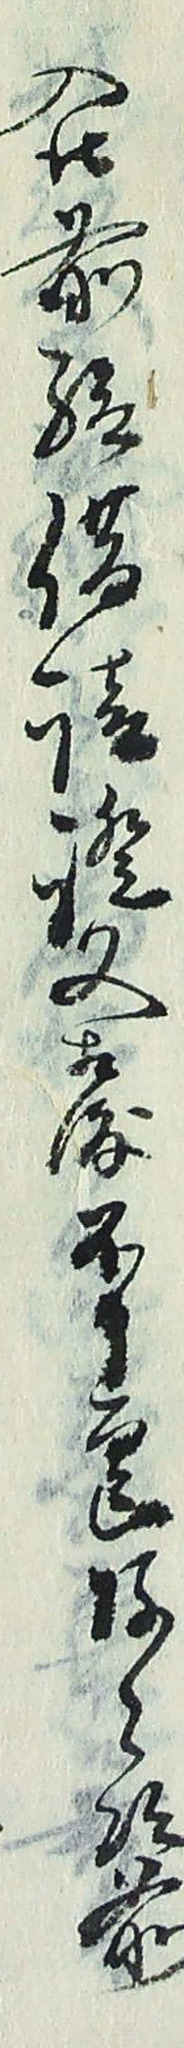入仕前給借請證文相渡不申而已ならす前
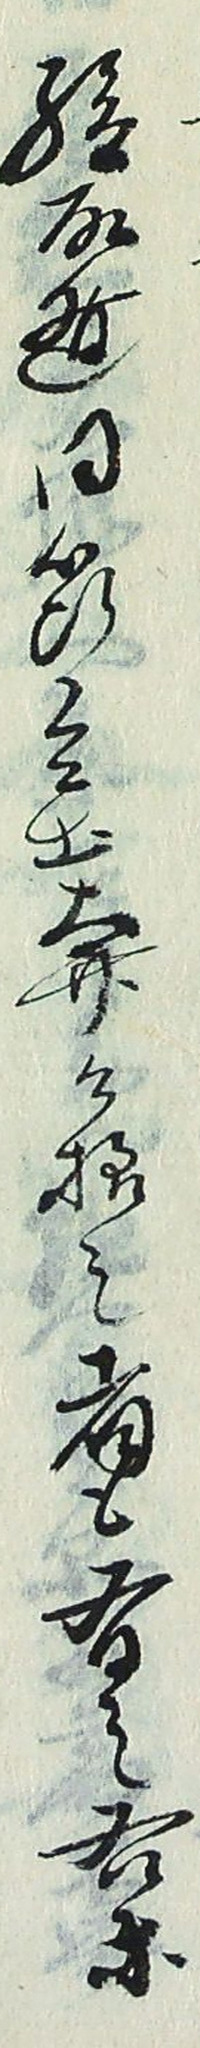給取遁同断令出奔候様之者も有之右等
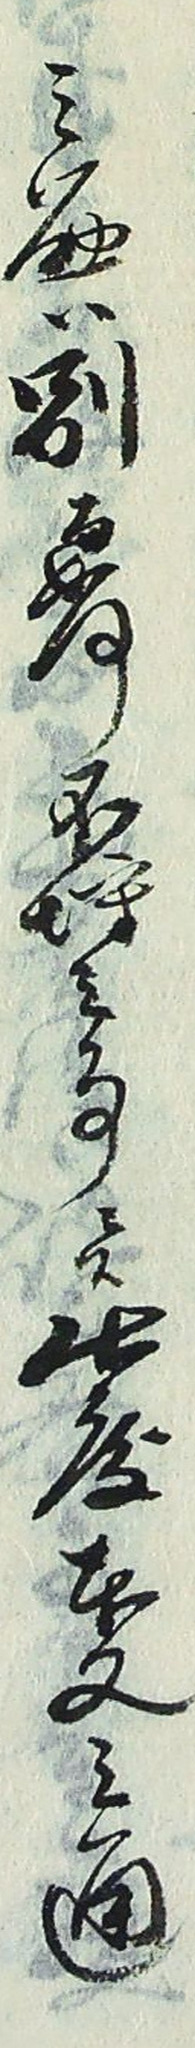之筋ハ別而如何不埒之事ニ候此度本文之通
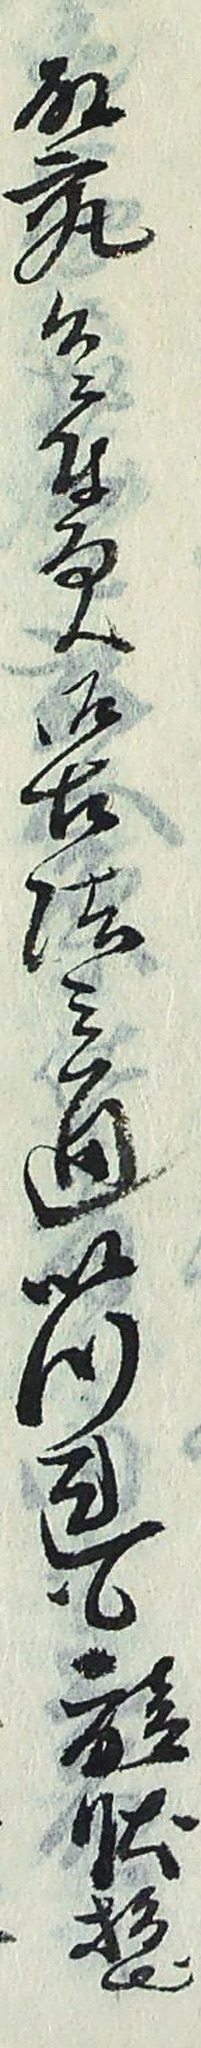取究候ニ付而ハ御古法之通いつれも請状指出
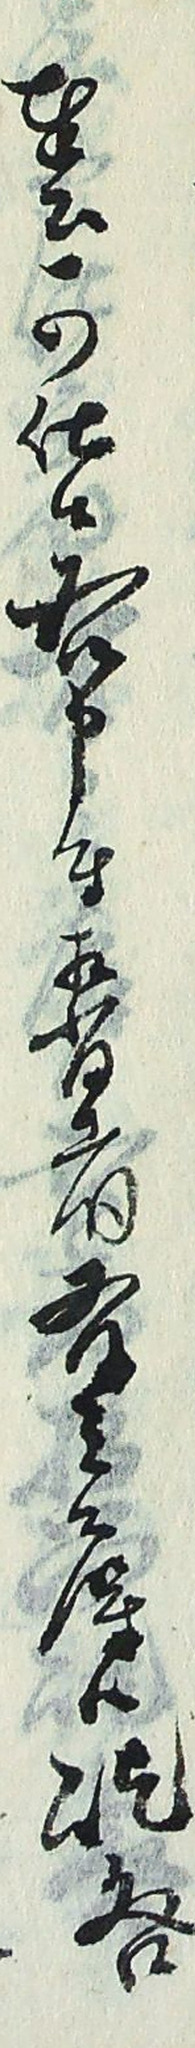奉公可仕候右申付相背者有之候得ハ屹咎
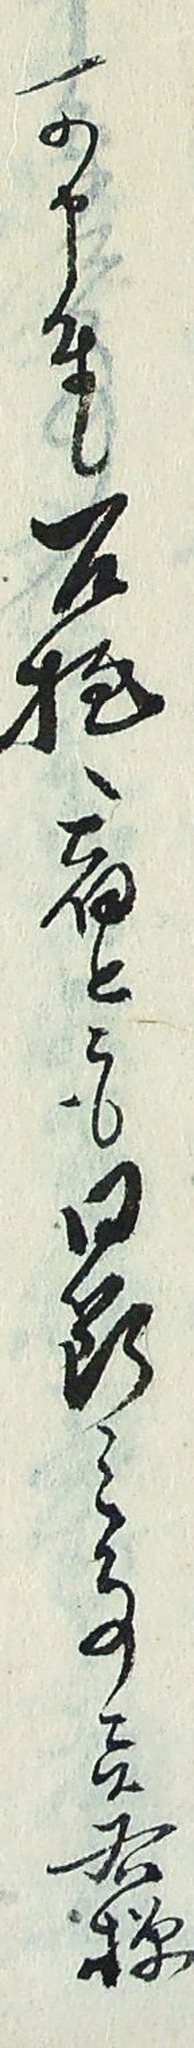可申付候召抱候者とても同断之事ニ候右様
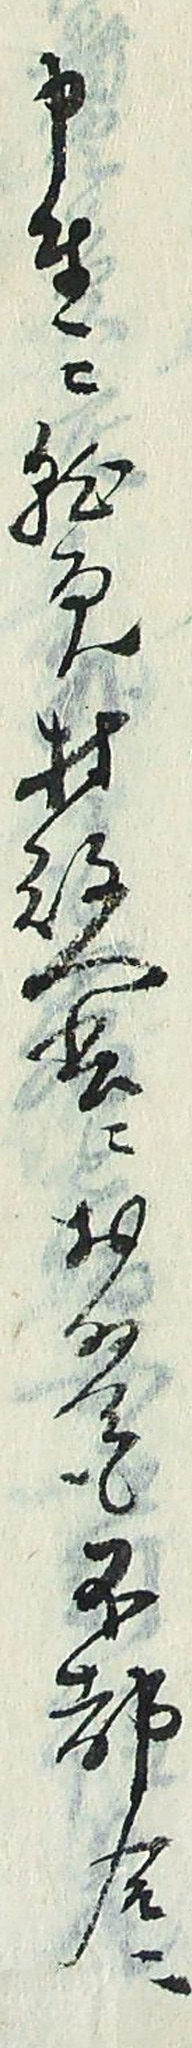申付候ニ就而ハ村役人共ニおゐても不都合ニ

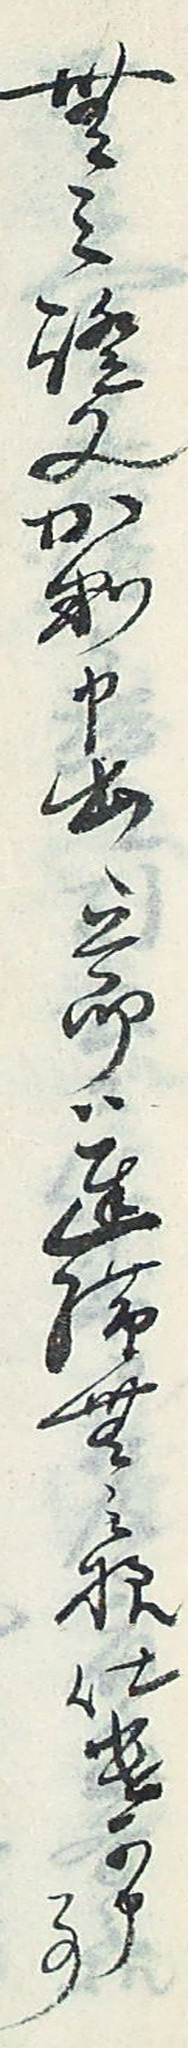無之證文加判申出候節ハ遅滞無之様仕遣可申事
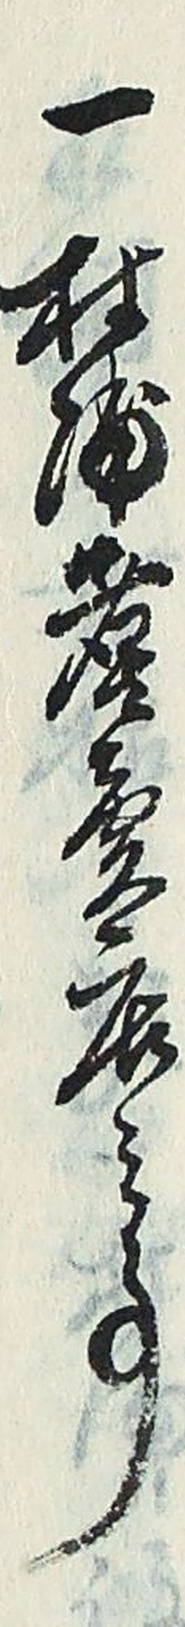一村浦煑賣店之事
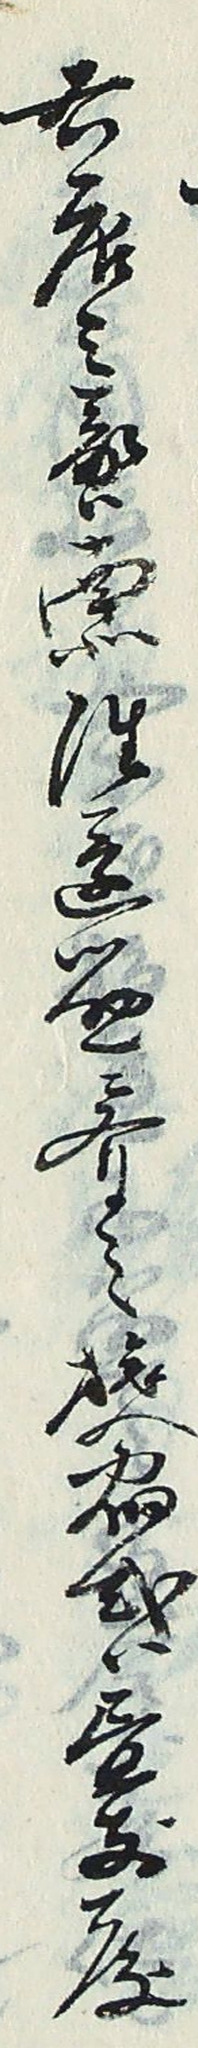右店之義ハ南北往還筋ニ有之旅人宿或ハ晝支度
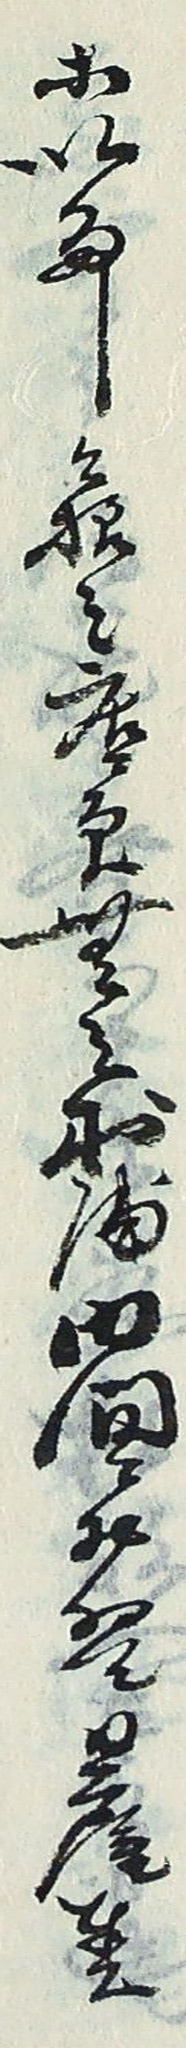等いたし候様之店ニ而ハ無之村浦内間ニおゐて日雇奉公
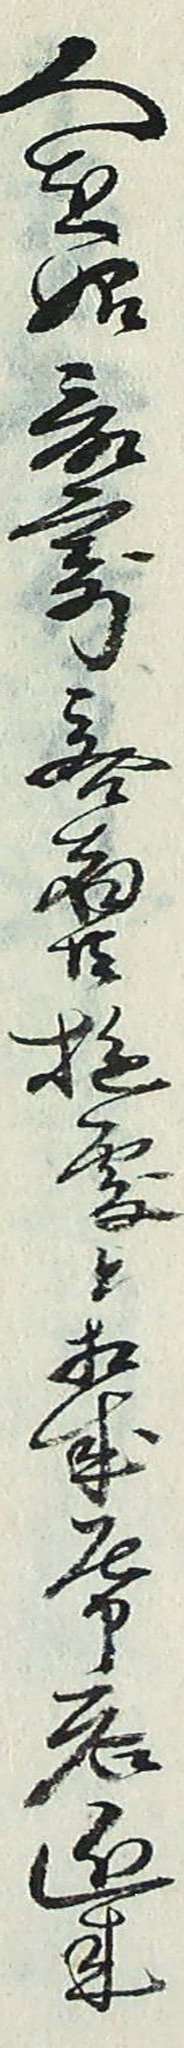人を始最寄若者共遊處と相成居申店近来
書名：諸御趣意書并御下知向之写
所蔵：鳴門教育大学 Naruto University of Education
